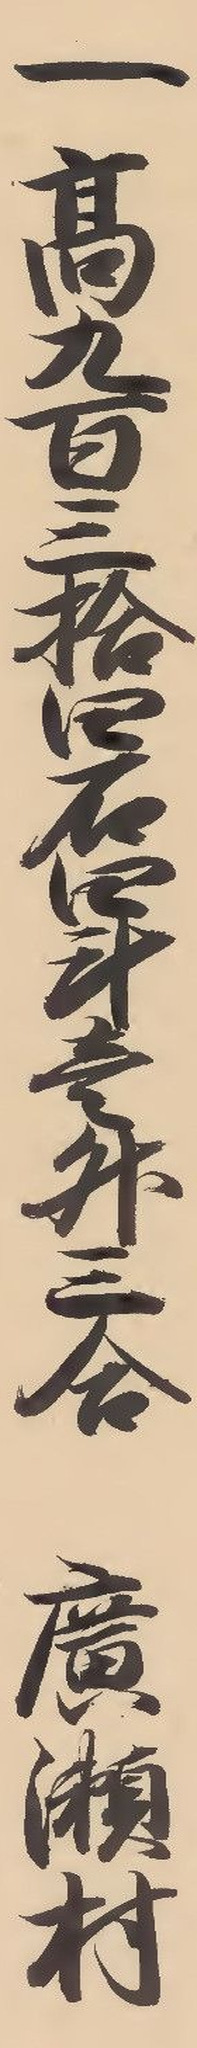一高九百三拾四石四斗壱升三合広瀬村
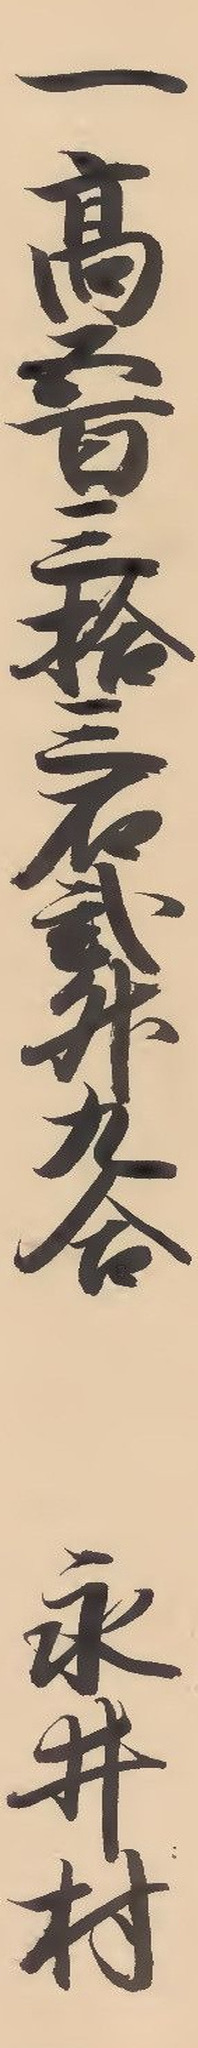一高五百三拾三石弐升九合永井村
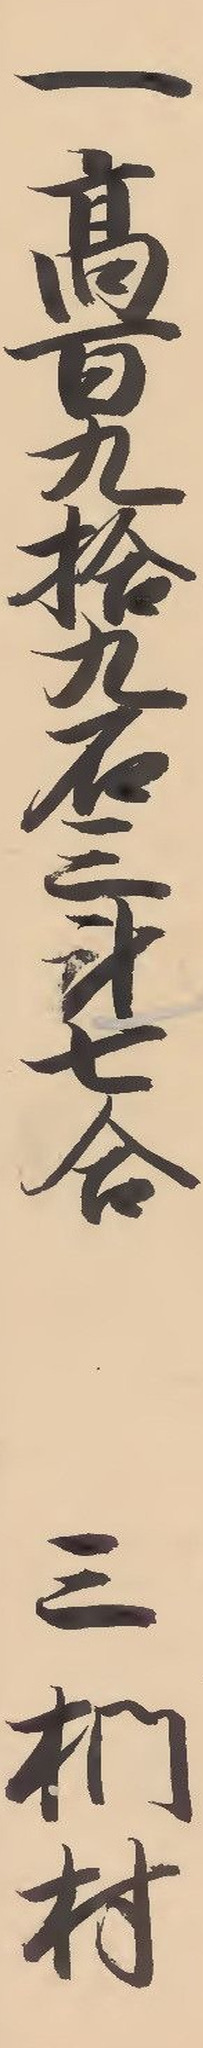一高百九拾九石三斗七合三椚村
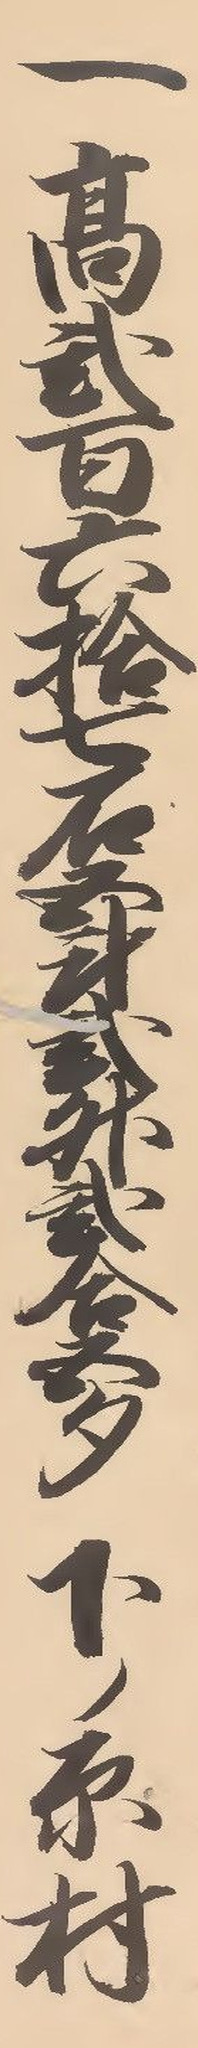一高弐百六拾七石五斗弐升弐合五勺下ノ原村
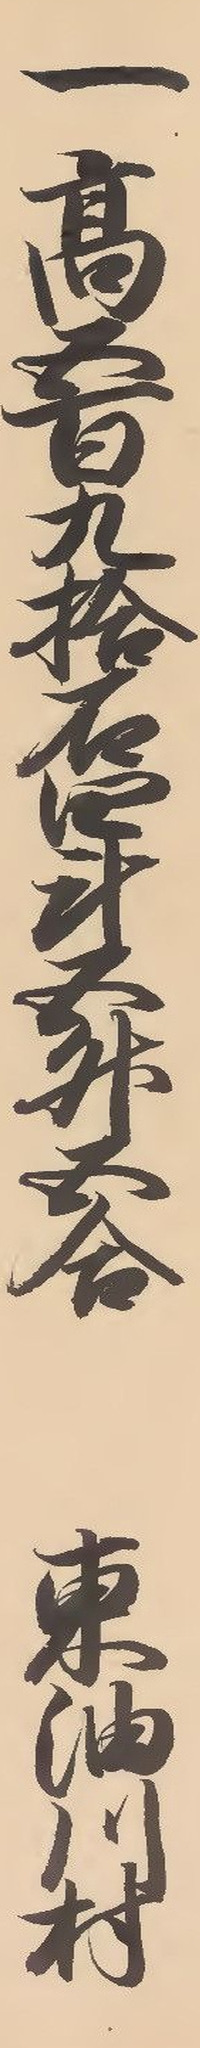一高五百九拾石四斗五升五合東油川村
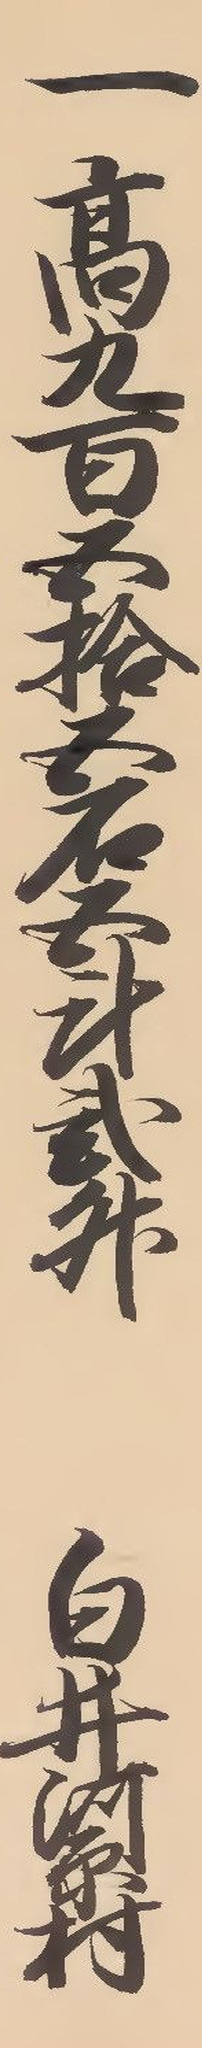一高九百五拾五石五斗弐升白井河原村
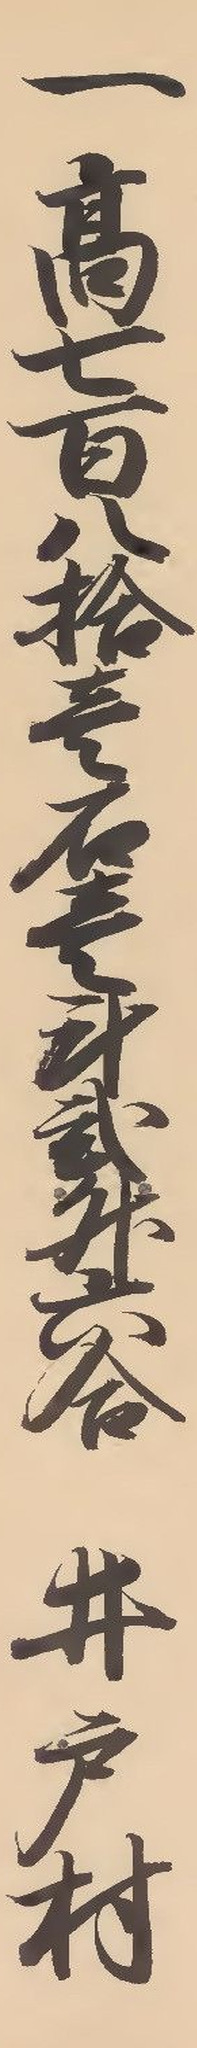一高七百八拾壱石壱斗弐升六合井戸村

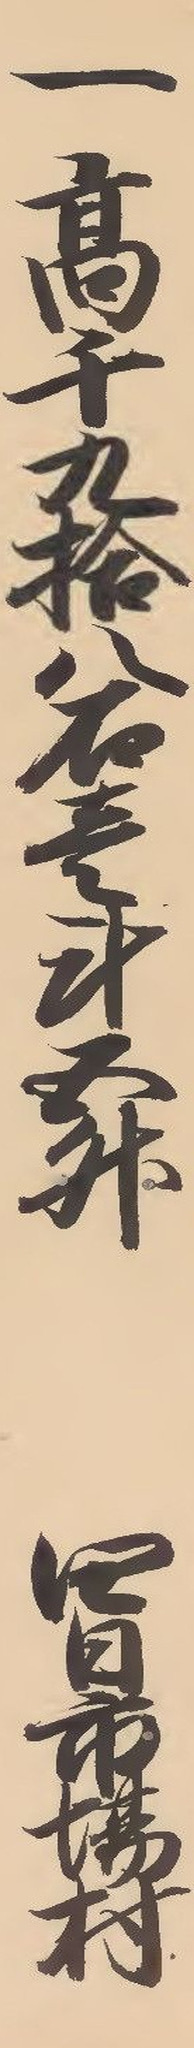一高千九拾八石壱斗五升四日市場村
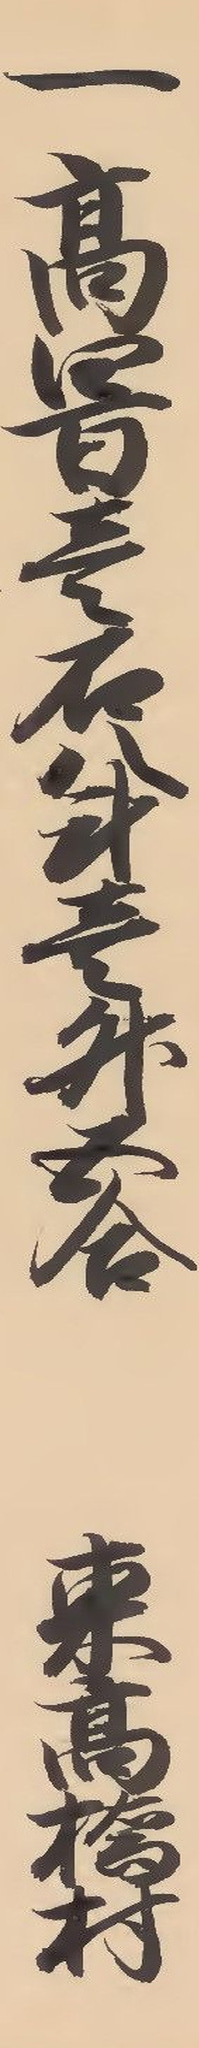一高四百壱石八斗壱升五合東高橋村
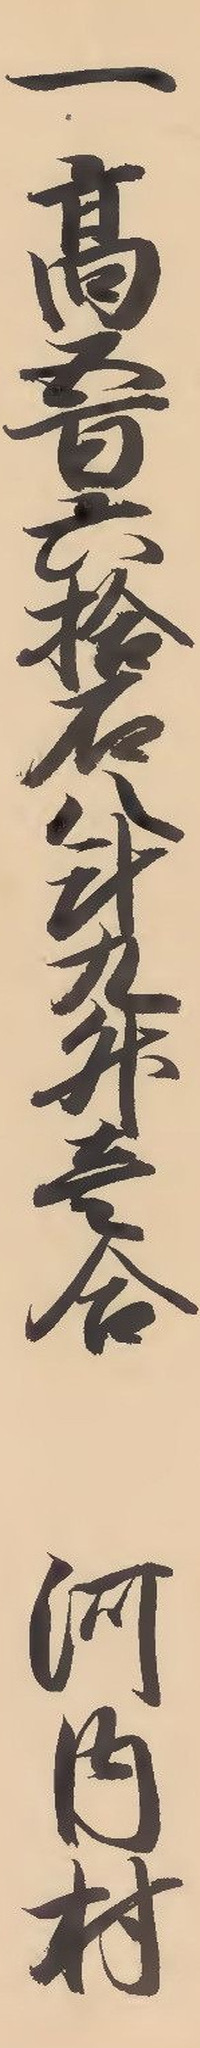一高五百六拾石八斗九升壱合河内村
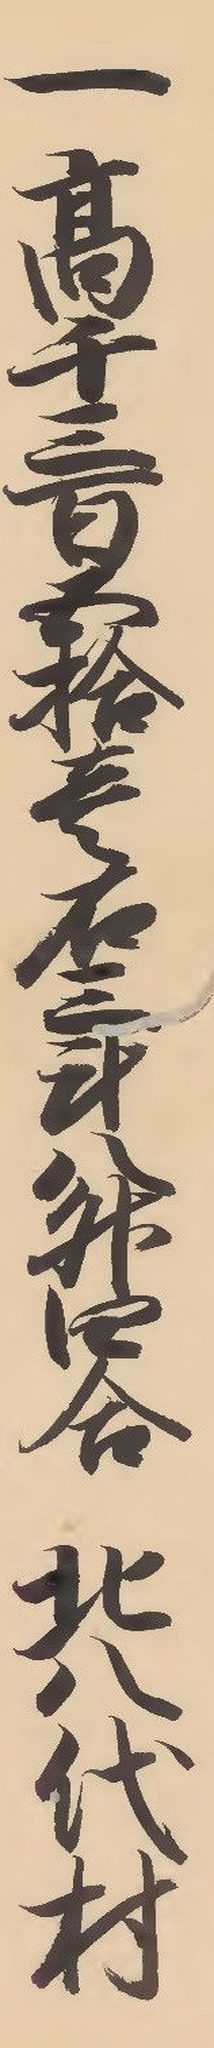一高千三百五拾壱石三斗八升四合北八代村
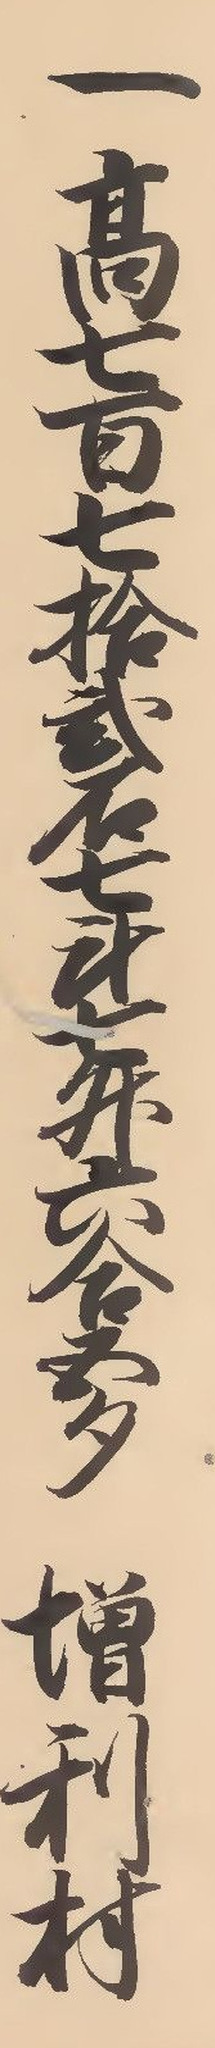一高七百七拾弐石七斗七升六合五勺増利村
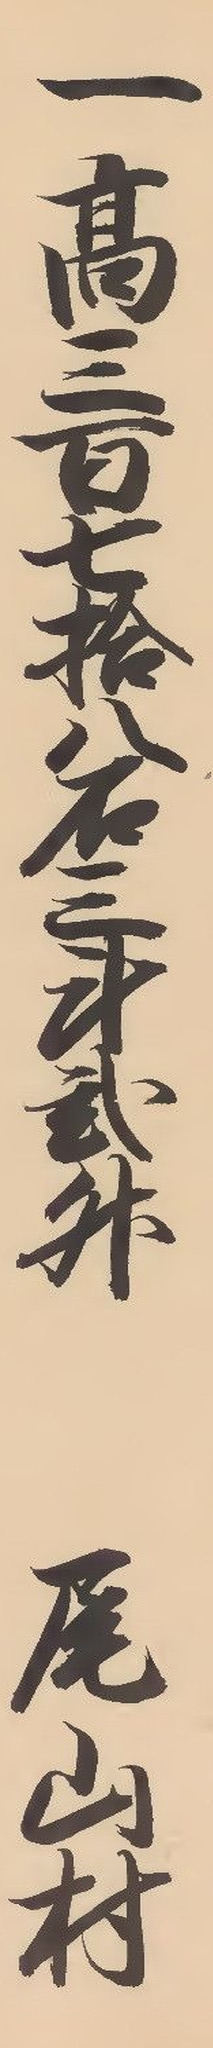一高三百七拾八石三斗弐升尾山村
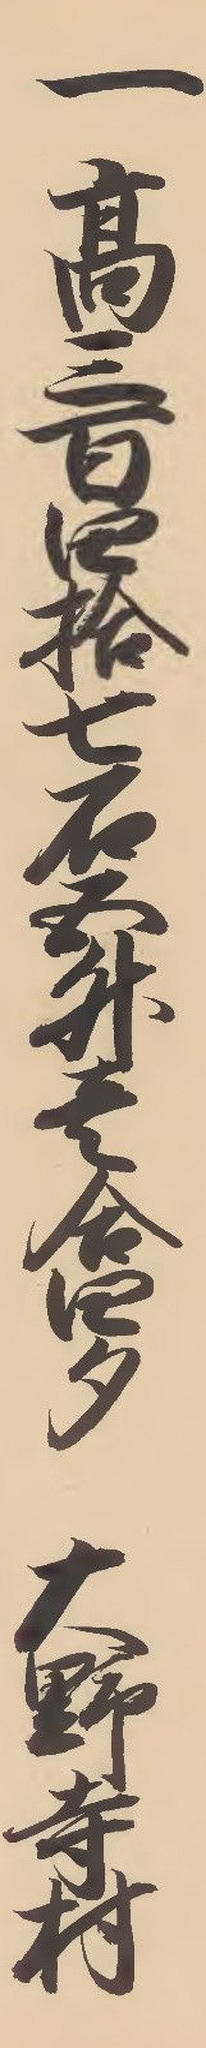一高三百四拾七石五升壱合四勺大野寺村
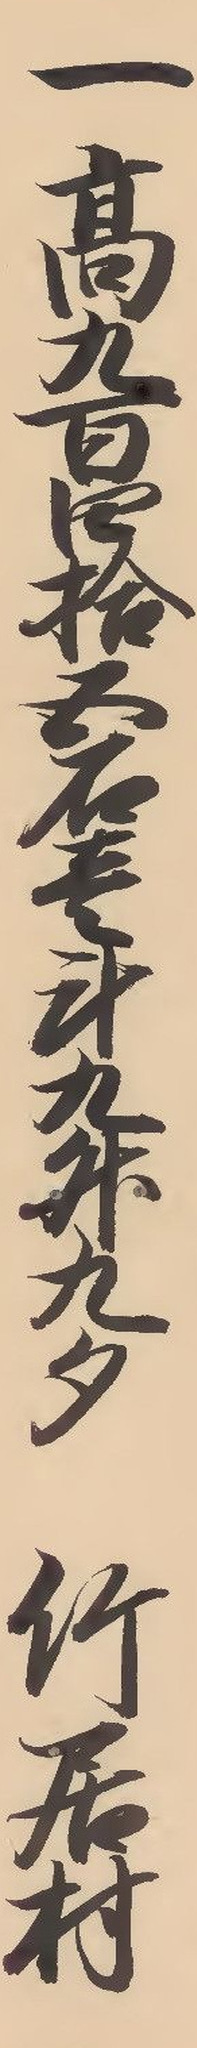一高九百四拾五石壱斗九升九勺竹居村

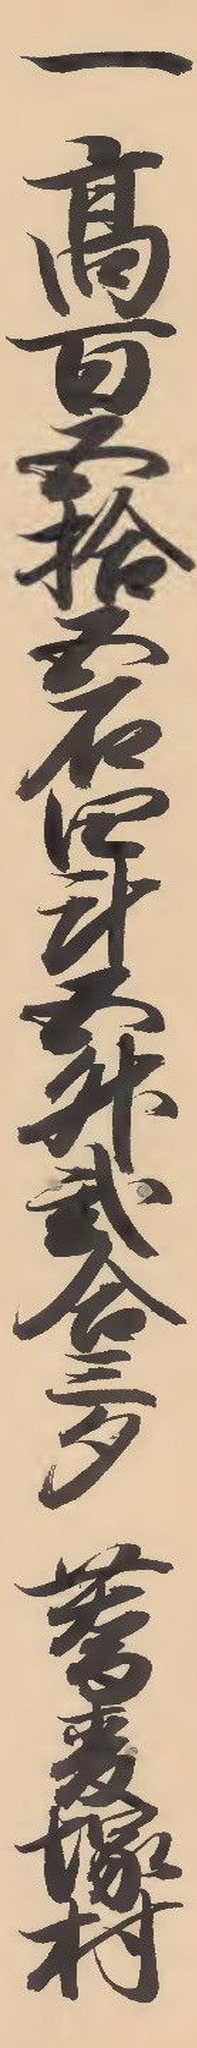一高百五拾五石四斗五升弐合三勺蕎麦塚村
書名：甲斐国郷帳
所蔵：国立公文書館 National Archives of Japan
